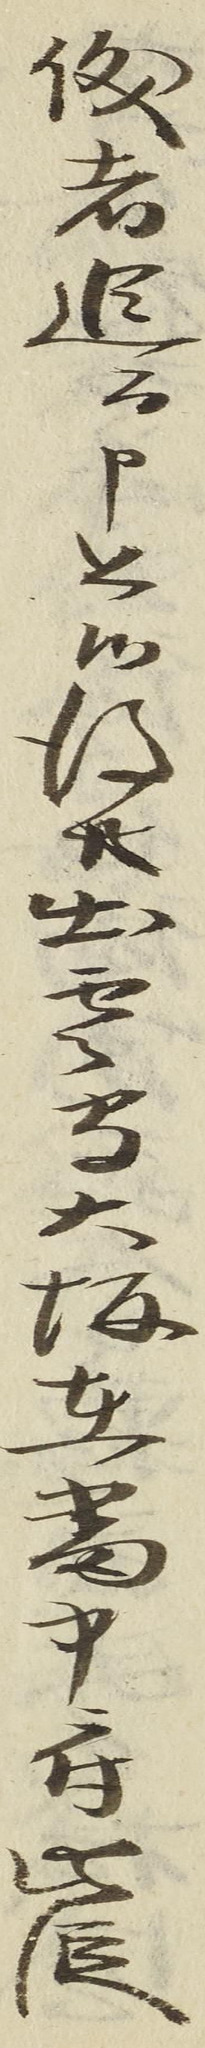儀は追而申上候得共出雲守大坂在番中二付此段
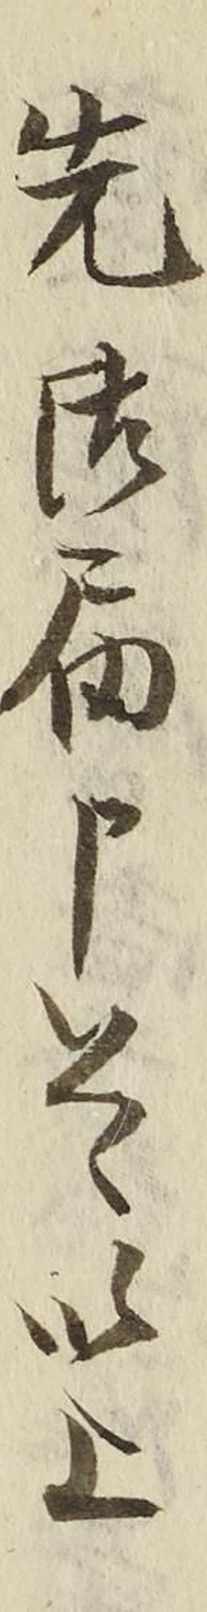先御届申上候以上
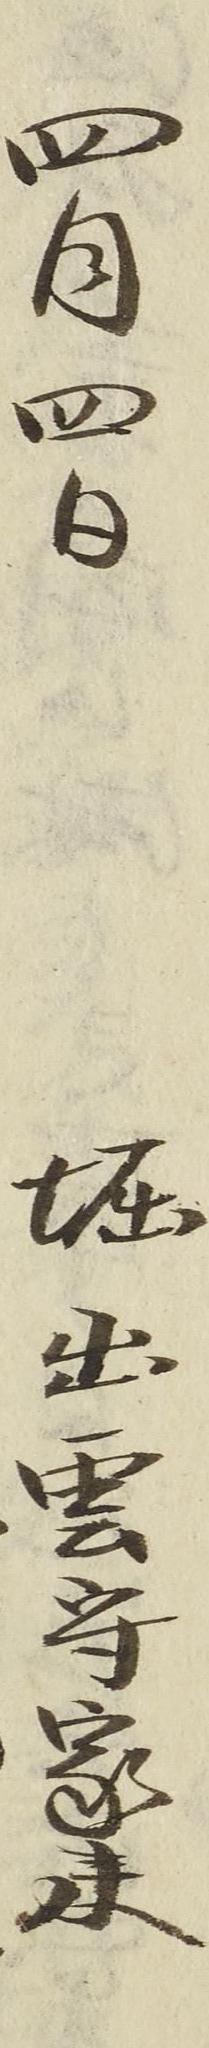四月四日堀出雲守家来
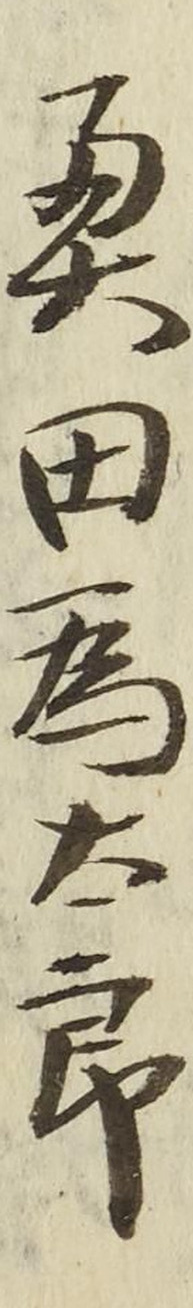奥田為太郎
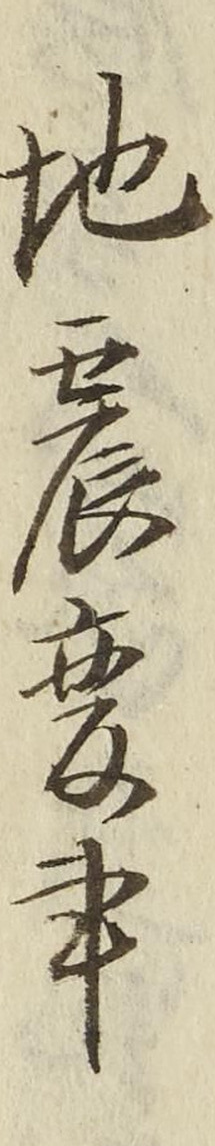地震変事
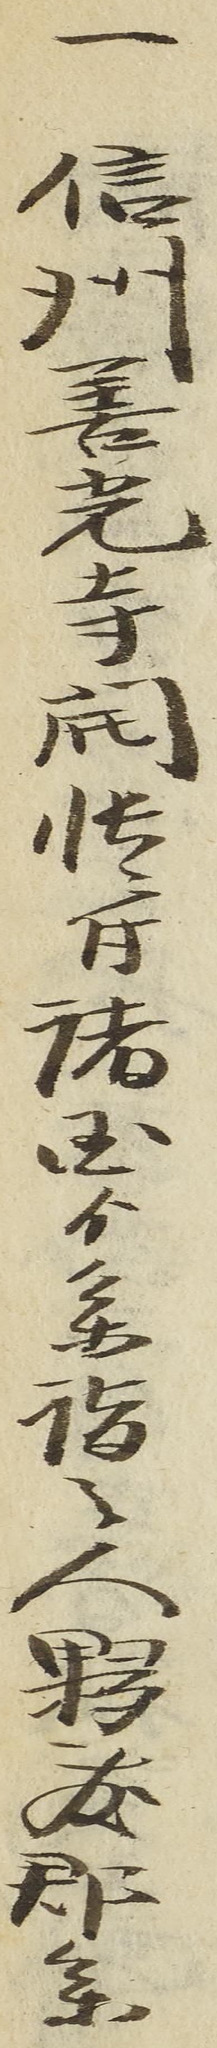信州善光寺開帳二付諸国ゟ参詣之人夥敷群集

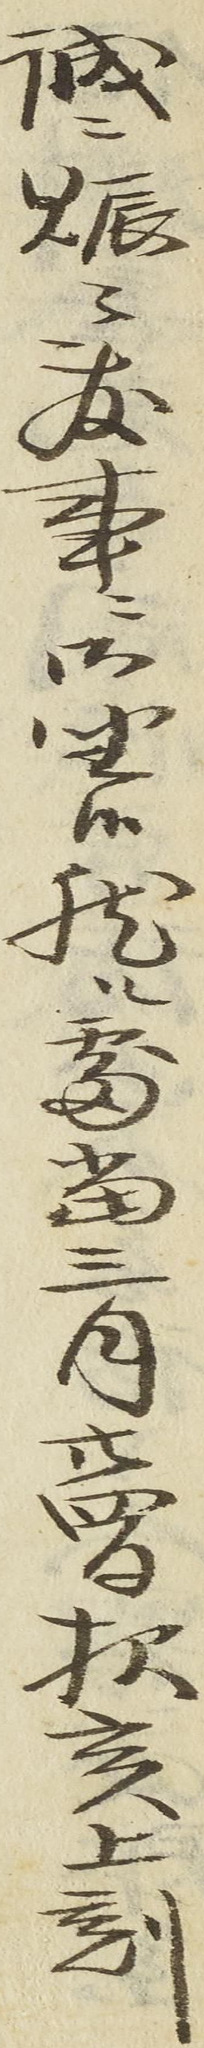誠二賑〃敷事二御坐候然ㇽ処当三月廿四日夜亥上刻
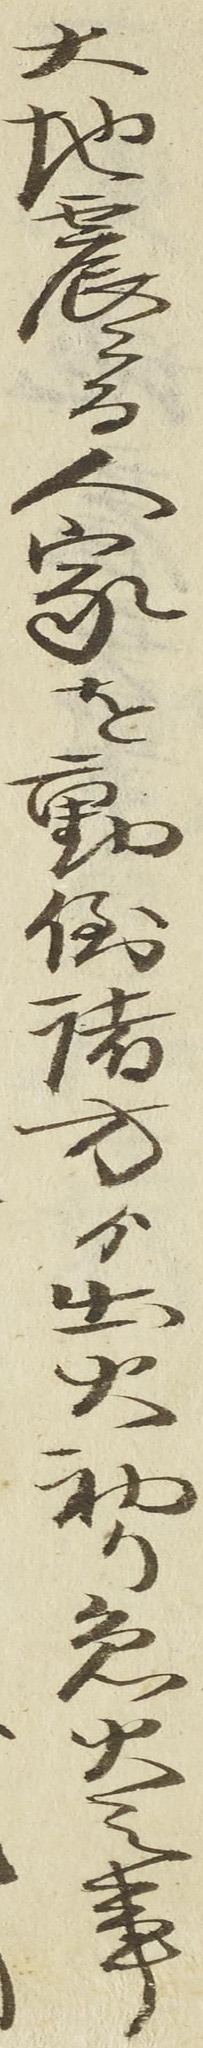大地震二而人家を動倒諸方ゟ出火初り急火之事
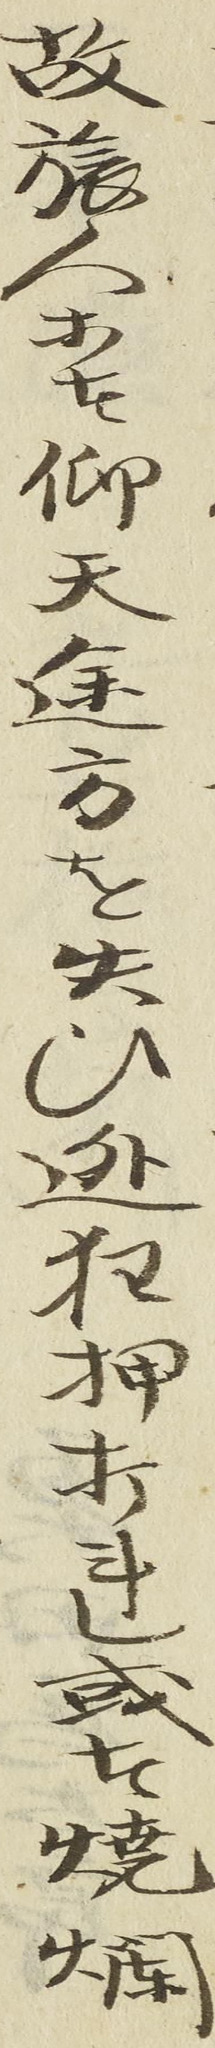故旅人等は仰天途方を失ひ逃狂押打れ或は焼烟
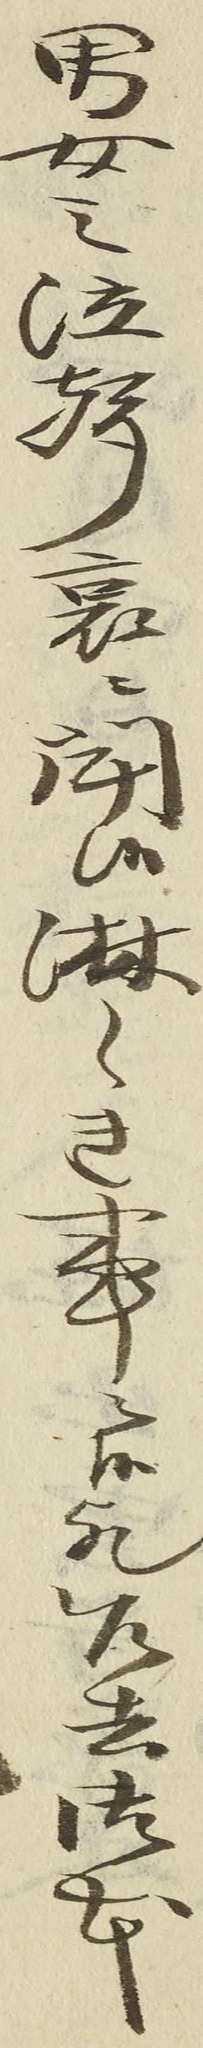男女之泣声哀二聞候淋しき事二候歟乍去本
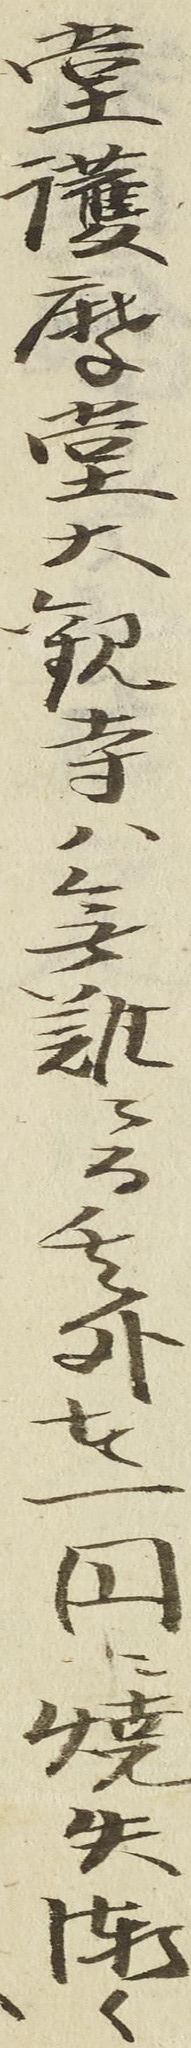堂護摩堂大勧寺ハ無難二而其外は一円二焼失漸々
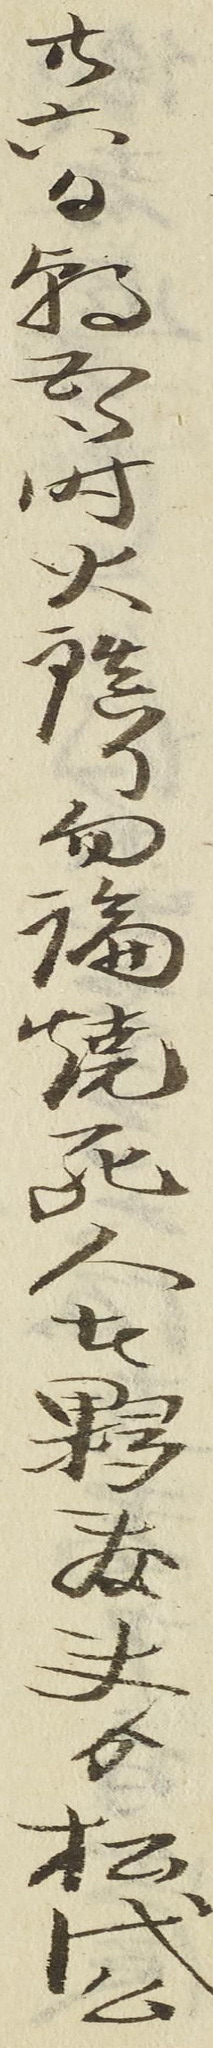廿六日朝五ッ時火鎮り勿論焼死人は夥敷夫ゟ松代公
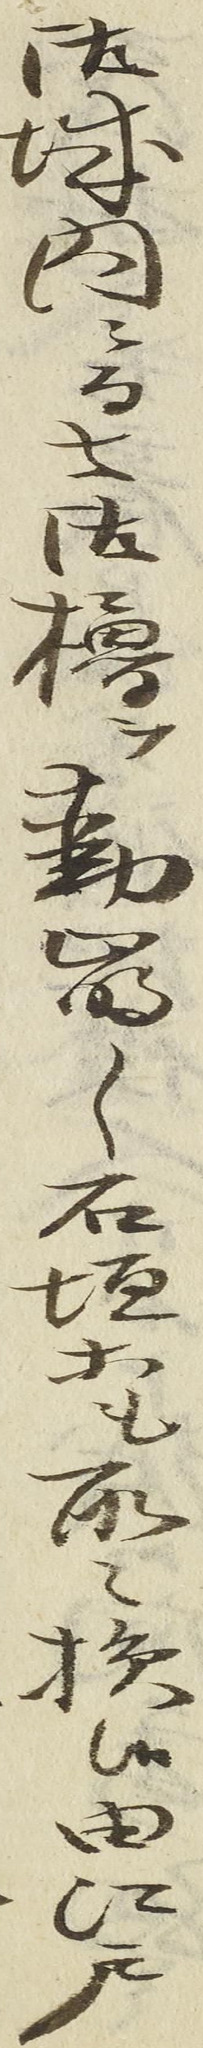御城内二而は御櫓ヲ崩し石垣等も所々損候由江戸
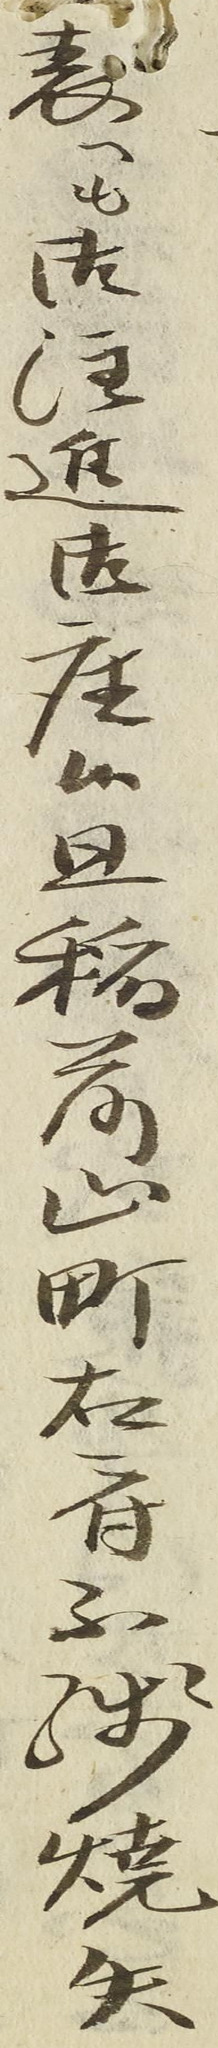表へも御注進御座候且稲荷山町右二付不残焼失
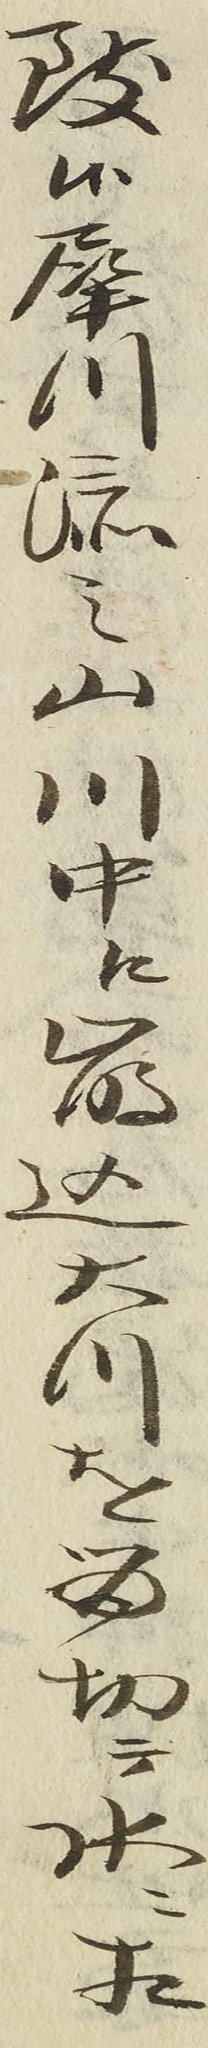致候犀川流之山川中江崩込大川を留切テ水二相
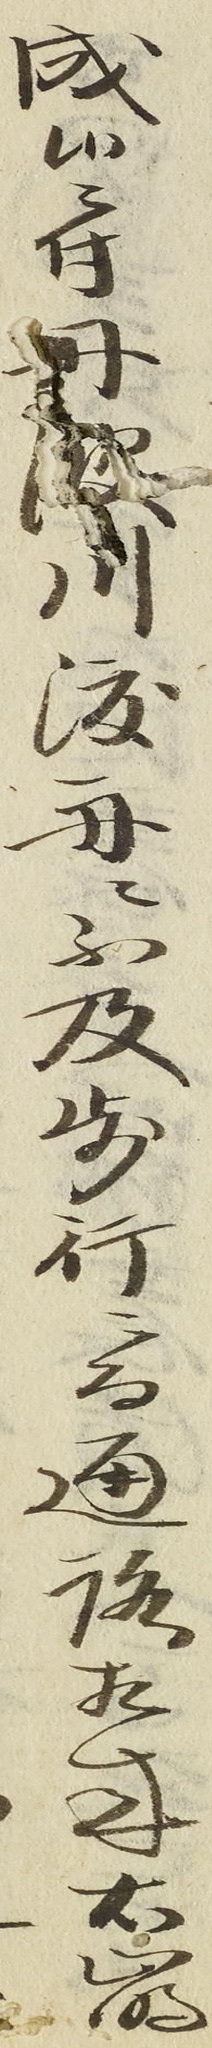成候二付丹波川渡舟二不及歩行二而通路相成右崩
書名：信濃國大地震記　乾
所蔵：東京大学地震研究所図書室 Earthquake Research Institute Library, The University of Tokyo, JAPAN
